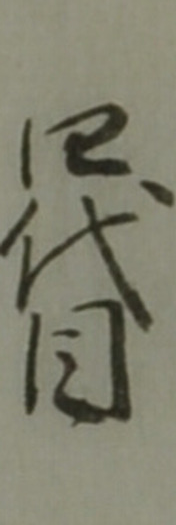四代目
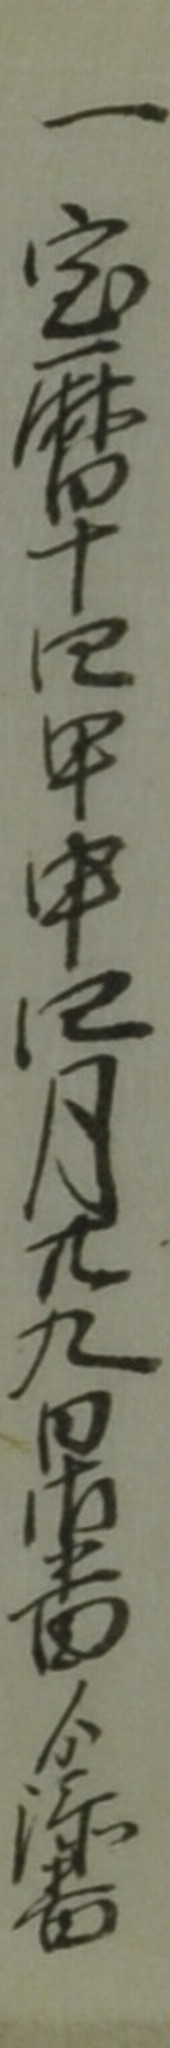一宝暦十四甲申四月廿九日御番より添番
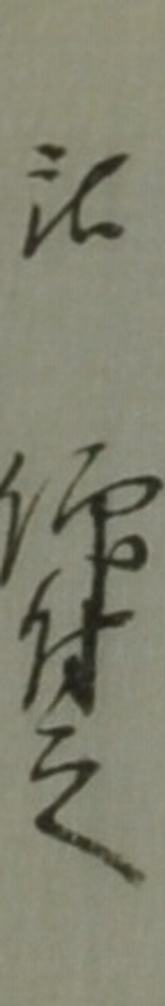被仰付之
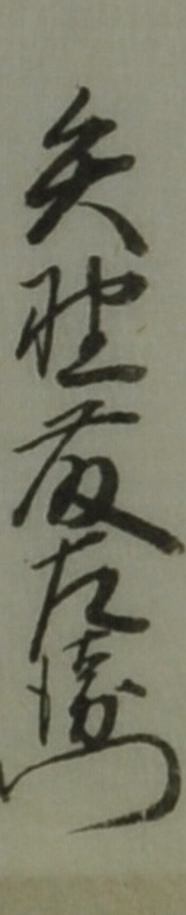矢野藤左衛門
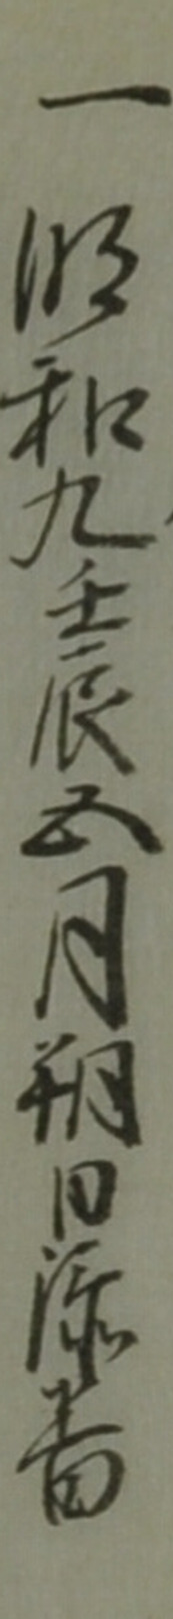一明和九壬辰五月朔日添番
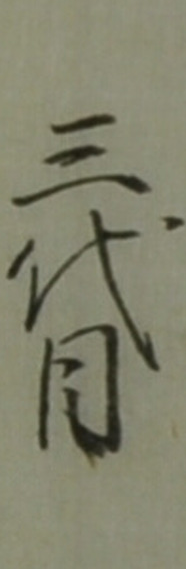三代目

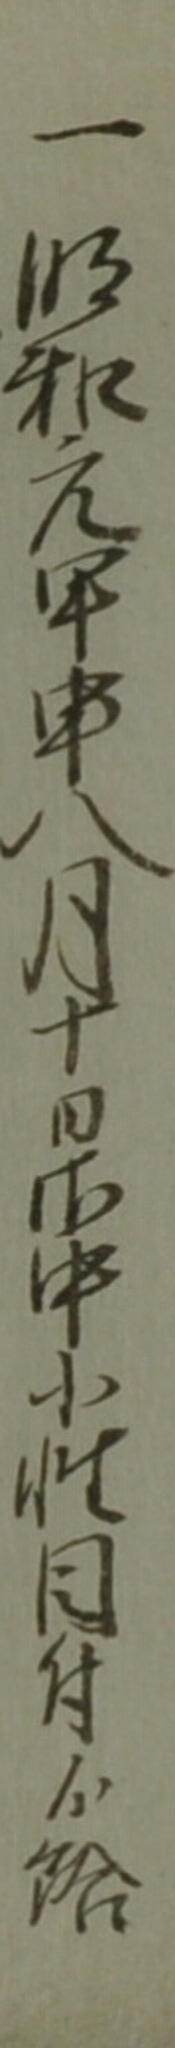一明和元甲申八月十日御中小姓目付より給
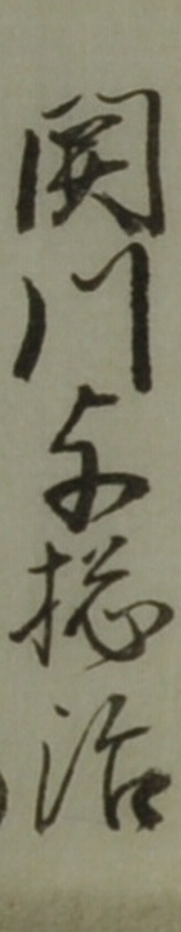関川与捴治
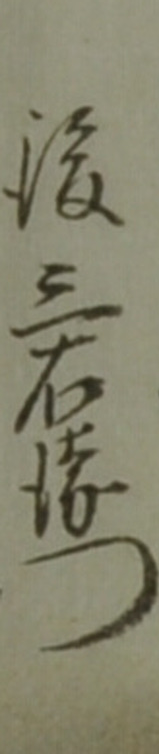後三右衛門
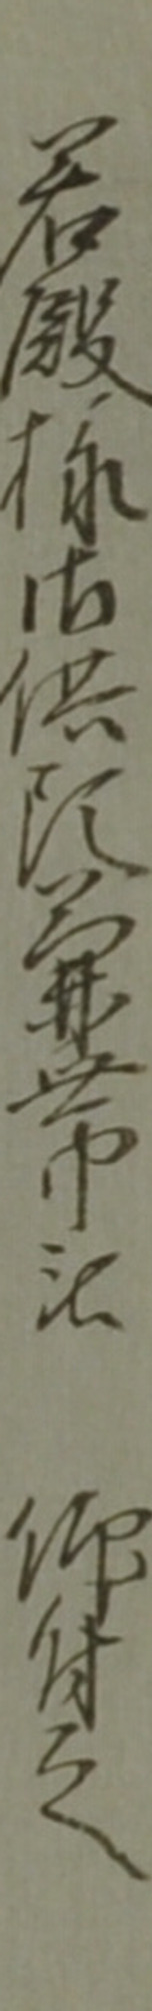若殿様御供頭兼帯被仰付之
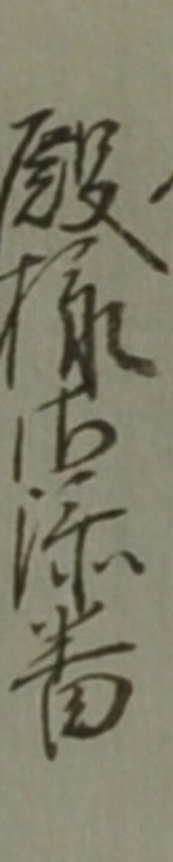殿様御添番
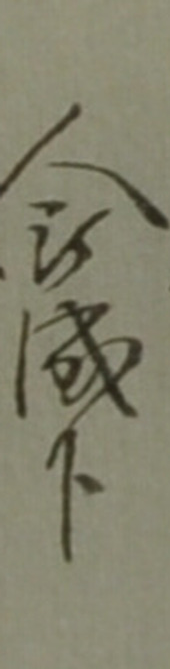人被成下
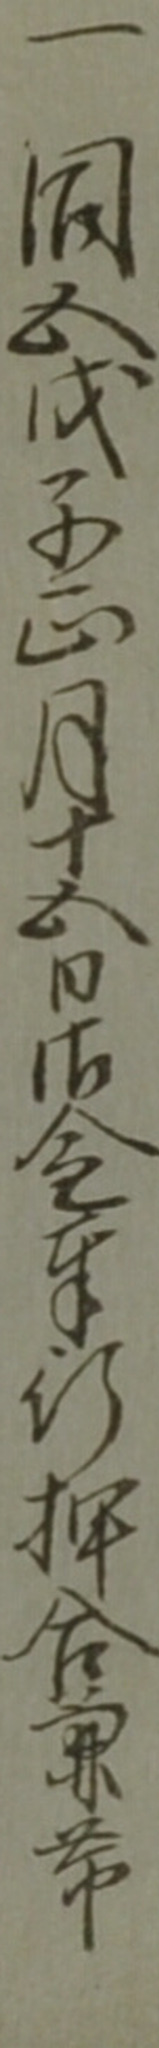一同五戊子正月十五日御金奉行押合兼帯
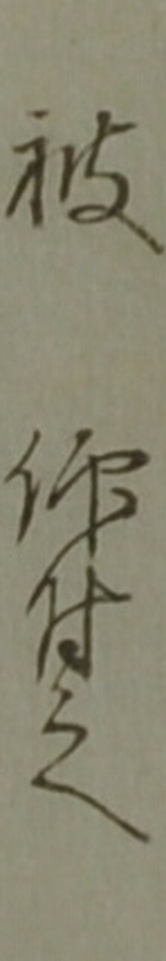被仰付之
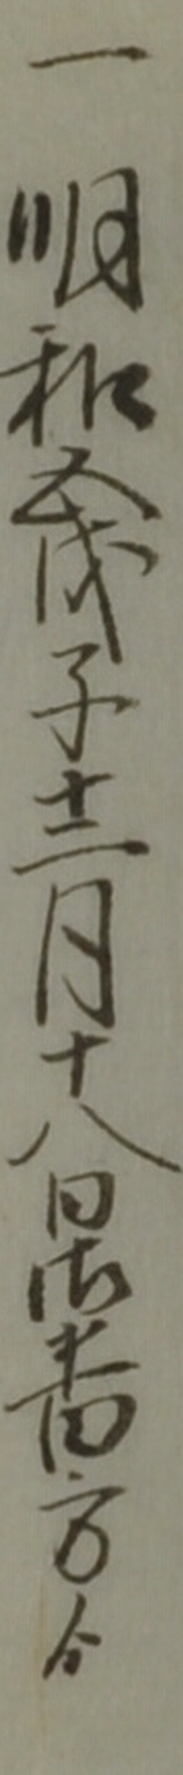一明和五戊子十二月十八日御番忝より
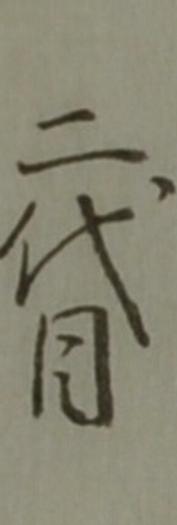二代目
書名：諸御役代々録（八）
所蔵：伊那市立高遠町図書館・合同会社AMANE
